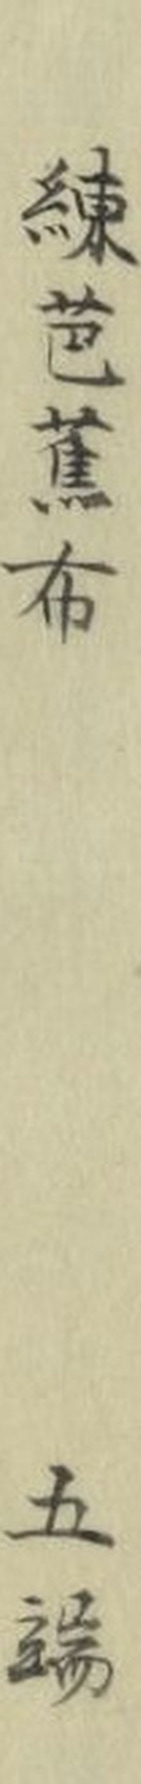練芭蕉布五端
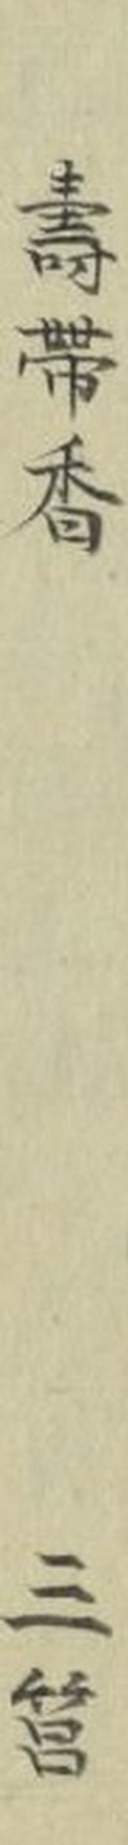寿帯香三筥
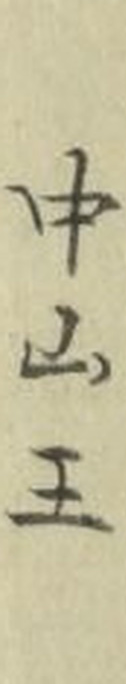中山王
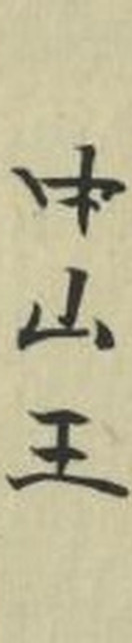中山王
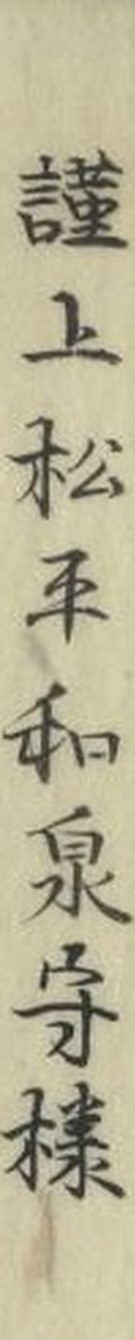謹上松平和泉守様
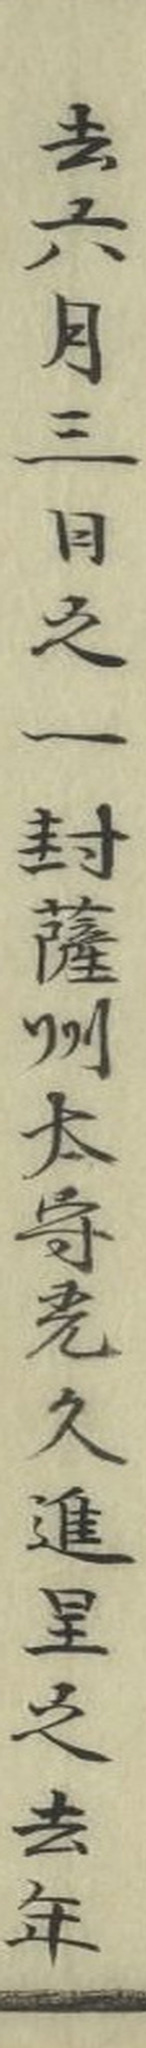去六月三日之一封薩州太守充久進呈之去年
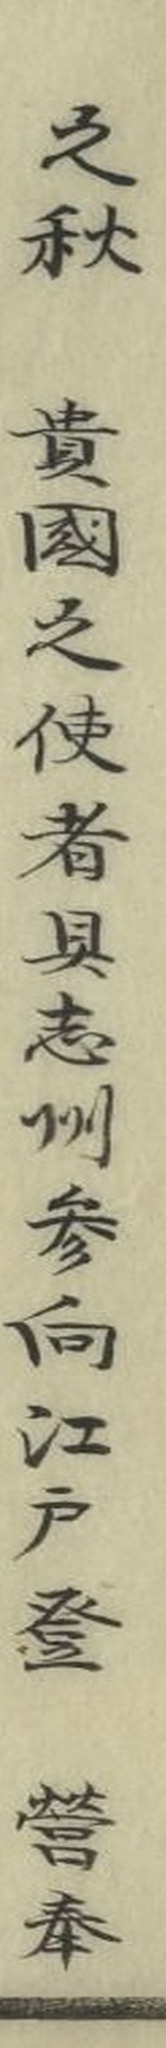秋貴国之使者具志州參向江戸登営奉
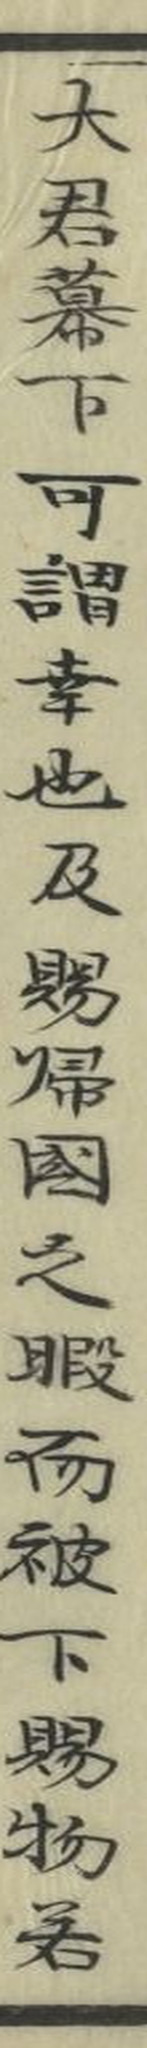大君幕下可所謂幸也及賜帰国之暇而被下賜物若

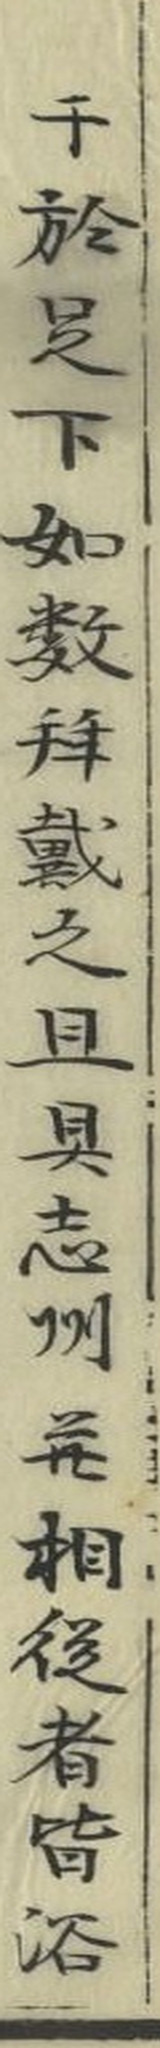于於足下如数拝戴之且具志州幷相従者皆浴
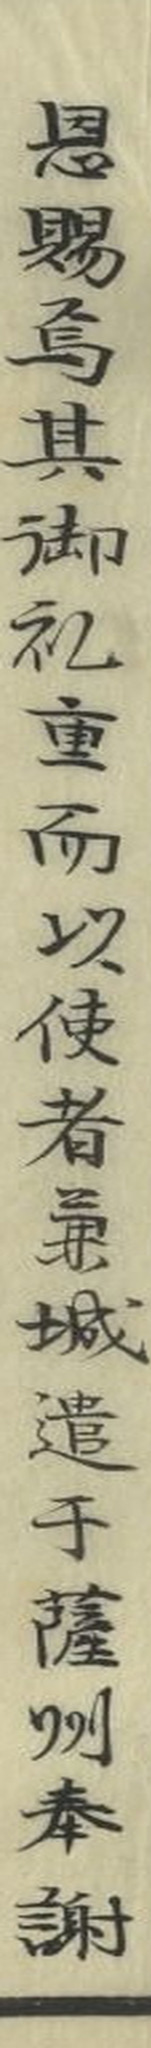恩賜焉其御礼重而以使者兼城遣于薩州奉謝
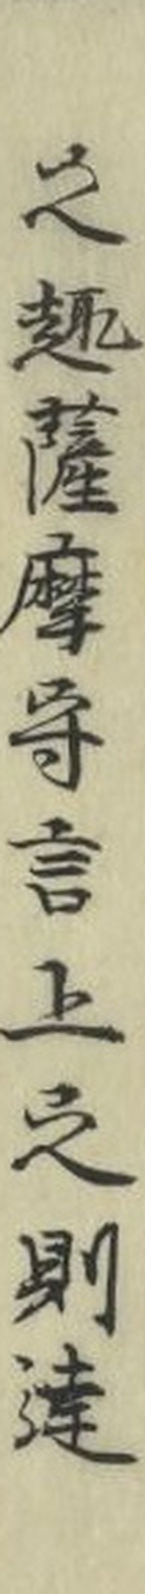之趣薩摩守言上之則達
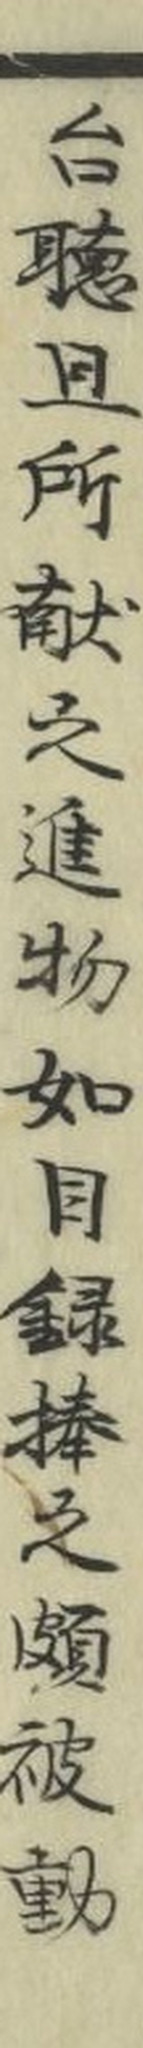台聴且所献之進物如目録捧之頗被動
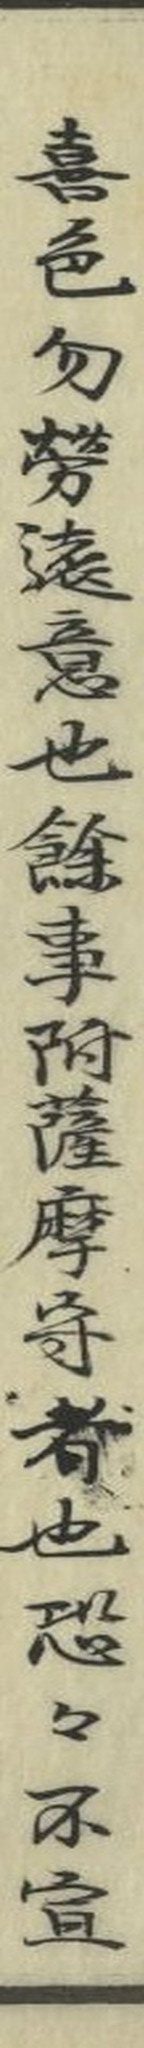喜色勿労遠意也余事附薩摩守者也恐々不宣
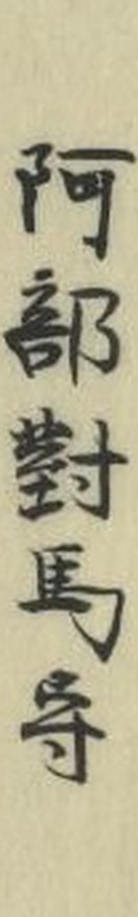阿部豊後守
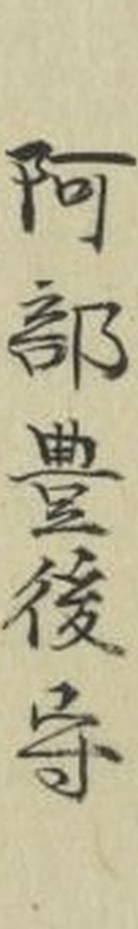阿部豊後守
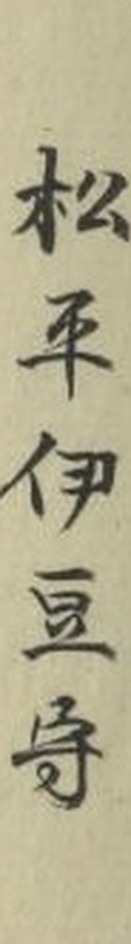松平伊豆守
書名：琉球往来（上）
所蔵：University of the Ryukyus Library
